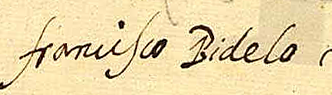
francisco Bidelo
